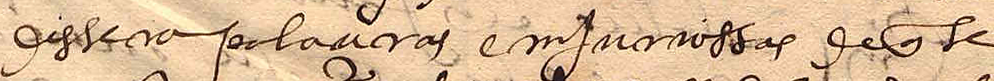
dissera palauras emJuriossas de q̄ se
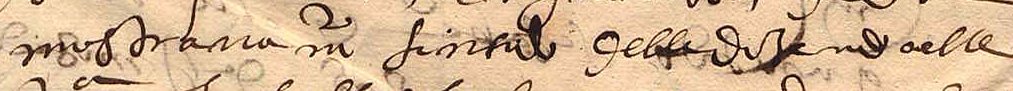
mostraua mto sintido delle dizendo a elle
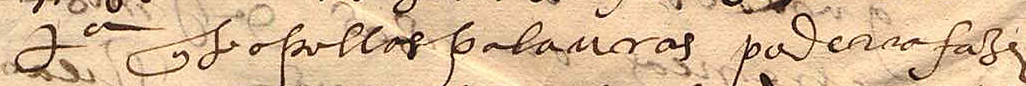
ta q̄ soo pollas palauras poderia fazer
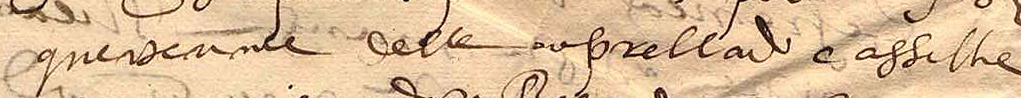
queixume delle ao prellado e assi lhe
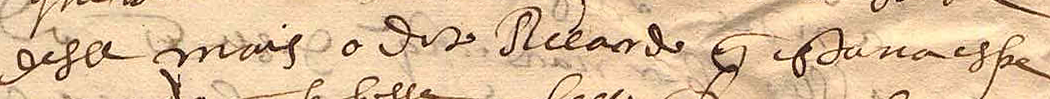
disse mais o dito Ricardo q̄ estaua espe
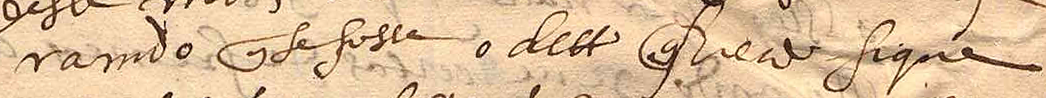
ramdo q̄ se fosse o ditto Ricado fique
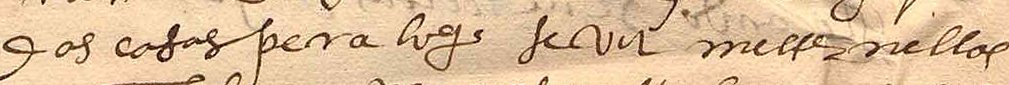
das casas pera logo se vir metter nellas
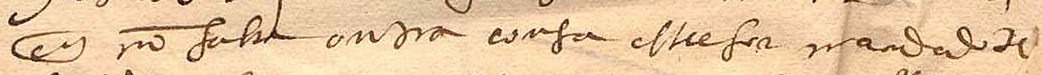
e q̄ nō sabia outra cousa e lhe foi mandado te
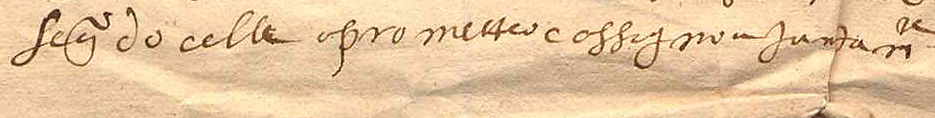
seḡdo e elle o prometteo e assignou Juntamte
